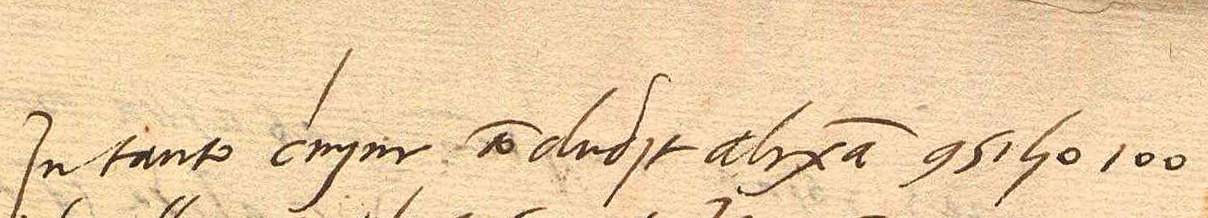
Jn tanto cimjne c̄ocludjt alexā ꝯsiljo 100
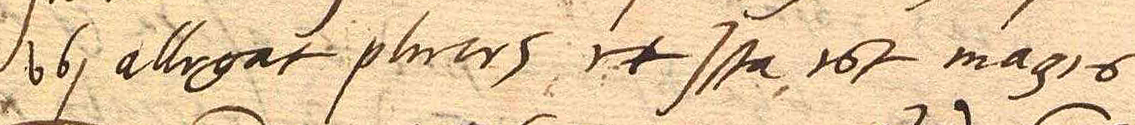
vbj allegat plures et Jsta est magis
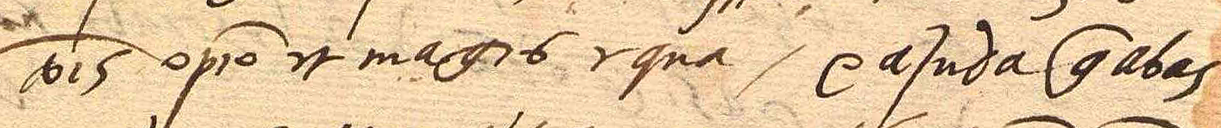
c̄ois opīo et magis equa / e aJnda q̄ a bas
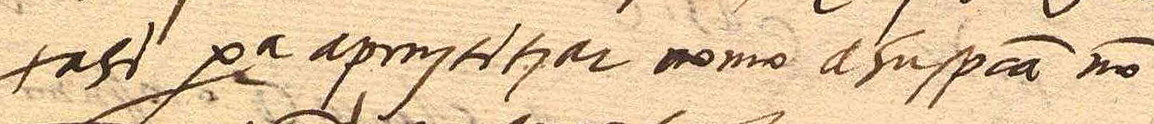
tasē ꝑa a penjtētjar como a suspçā nō
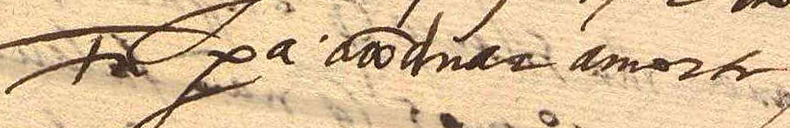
tē ꝑa a cōdenar a morte
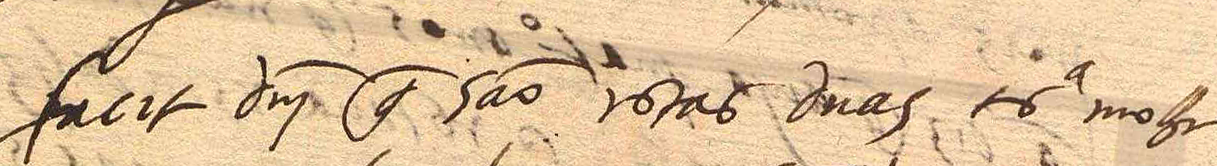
facit dnj̄ q̄ são estas duas tsa molhe
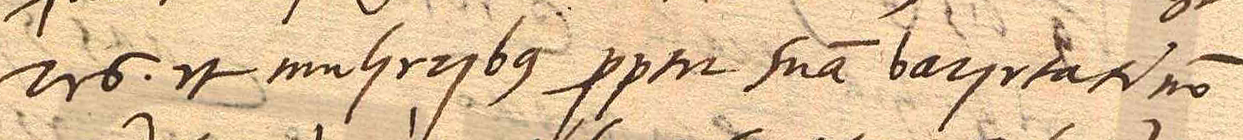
res et muljerjbꝯ ꝓpter suā varjetatē nō
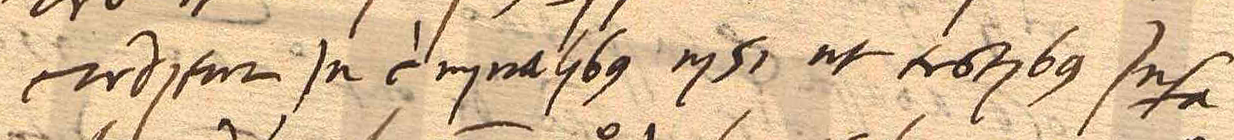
credjtur Jn cimjnaljbꝯ njsi ut testjbꝯ Jn fa
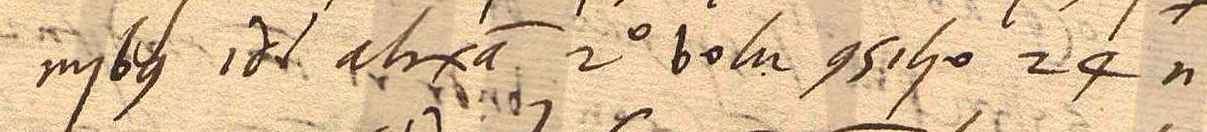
mjbꝯ idē alexā 2o volu ꝯsiljo 24 no
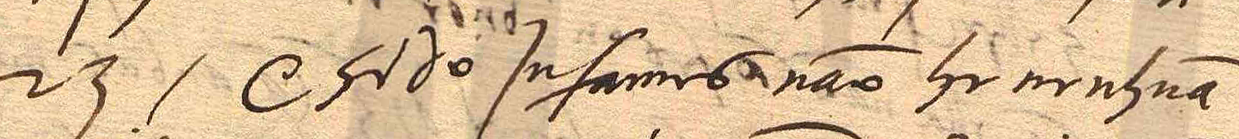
23 / e sēdo Jnfames não he nenhuā
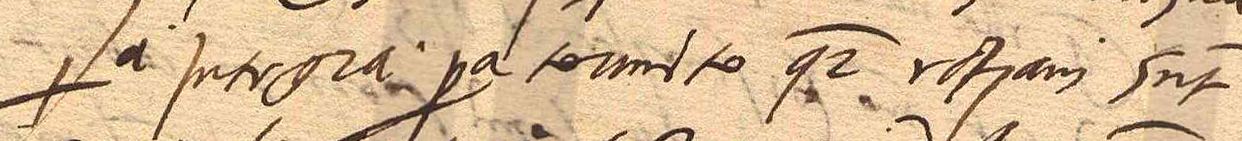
ta Jntegra ꝑa tormēto q̄r ectjam snt̄
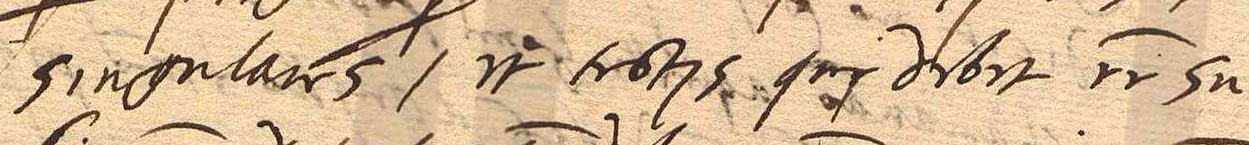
singulares / et testjs que debet ēe su
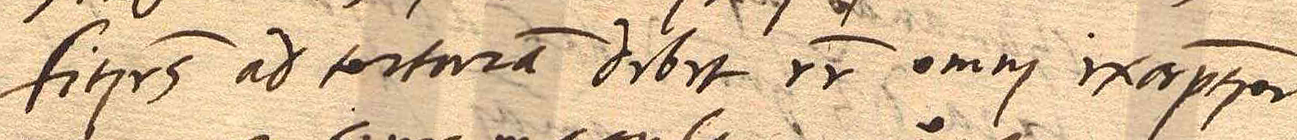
fitjēs ad torturā debet ēe omnj excep̄tjoe
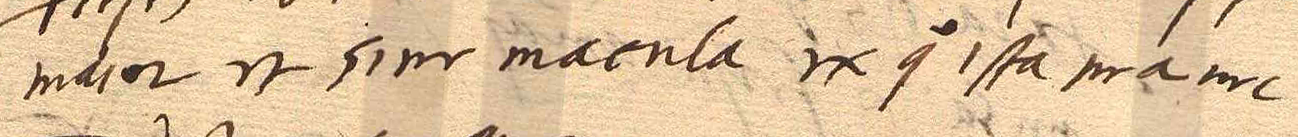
maior et sine macula ex qo ista re a nec
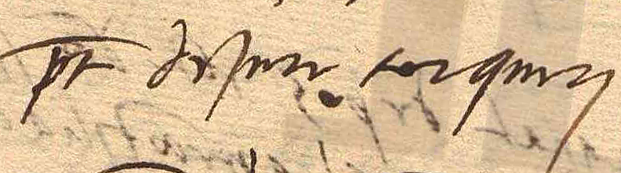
p̄t de Jure torquerj
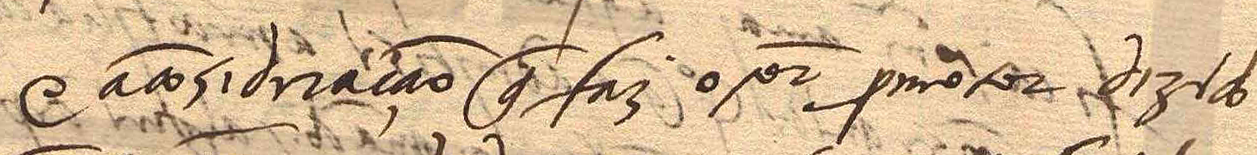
e a cōsideração q̄ faz o sōr ꝓmotor dizēdo
